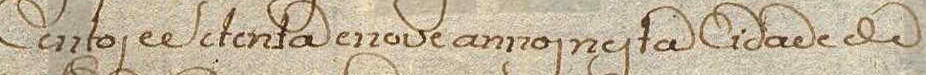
Centos e setenta e nove annos nesta Cidade de
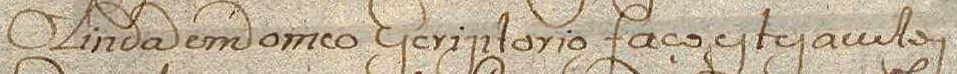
OLinda em o meo Escriptorio faço estes autos
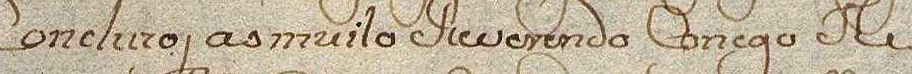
Concluzos ao muito Reverendo Conego The
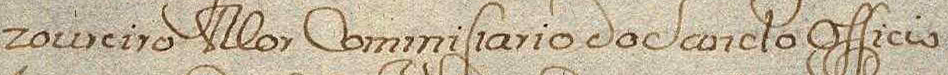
zoureiro Mor Commissario do Sancto Officio
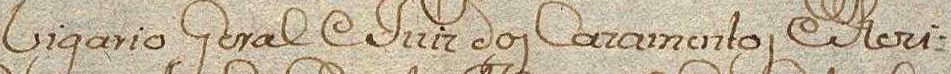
Vigario Geral e Iuiz dos Cazamentos e Rezi
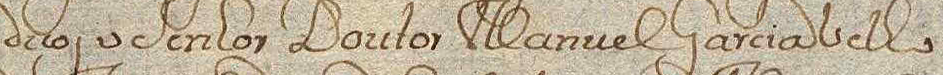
duos o Senhor Doutor Manuel Garcia velho
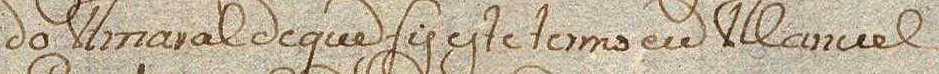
do Amaral de que fis este termo eu Manuel
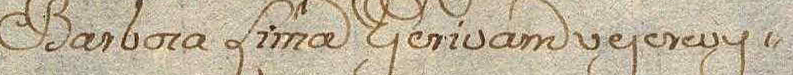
Barboza Lima Escrivam o escrevy//
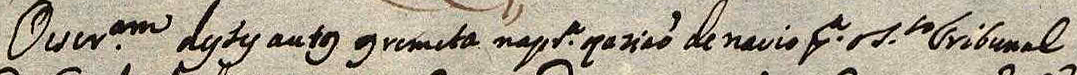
O escr.am destes autos os remeta na pr.a ocaziaõ de navio p.a o S.to Tribunal
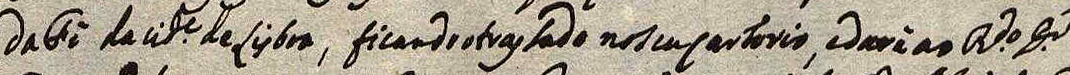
da Fé da cid.e de Lisboa, ficando o traslado no seu Cartorio, e dasi ao R.do D.r
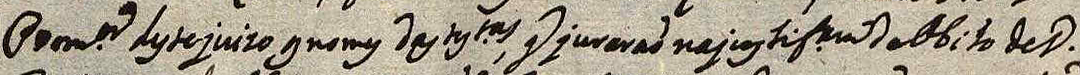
Prom.or deste juizo os nomes das tes.tas q̄ juraraõ na justif.am do Obito de D.
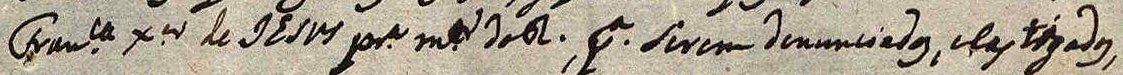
Fran.ca x.r de Iesus pr.a m.er do R., p.a serem dennunciados, e castigados,
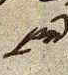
por
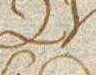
21
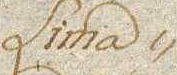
Lima//
